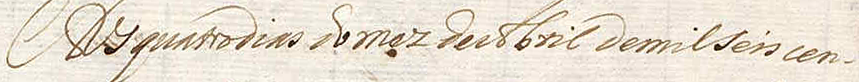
Aos quatro dias do mez de Abril de mil seiscen
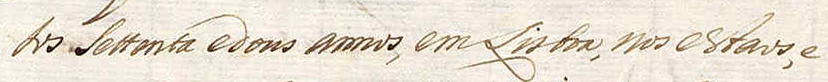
tos Settenta e dous annos, em Lisboa, nos estaos, e
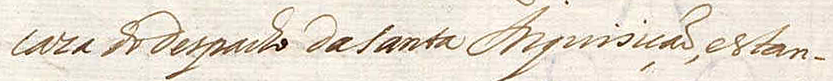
caza do despacho da santa Inquisição, estan
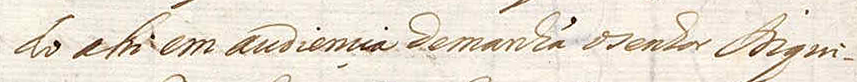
do ahi em audiencia de manhã o senhor Inqui
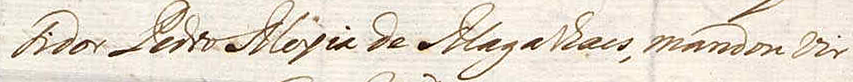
sidor Pedro Mexia de Magalhaes, mandou vir
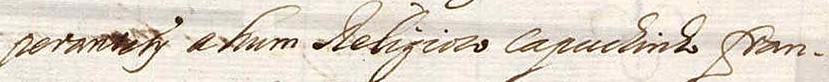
perante Sy a hum Religiozo capuchinho fran
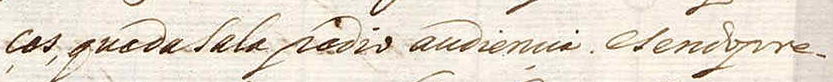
ces, que da Sala pedio audiencia. e sendo pre
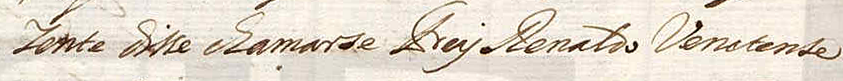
zente disse chamarse Frey Renaldo Venetense
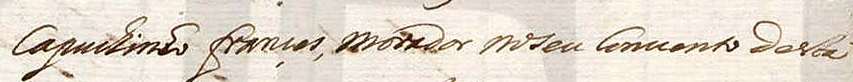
Capuchinho frances, morador no seu Conuento desta
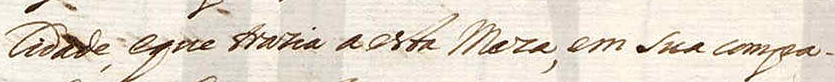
Cidade em que trazia a esta Meza, em sua compa
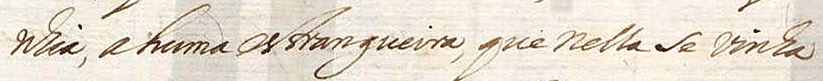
nhia, a huma estrangeira, que nella se vinha
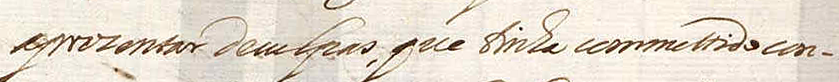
aprezentar de culpas, que tinha commettido con
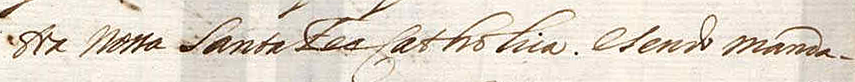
tra nossa Santa Fee Catholica. E sendo manda
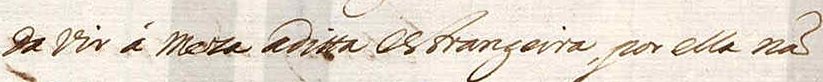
da vir á meza a ditta estrangeira, por ella naõ
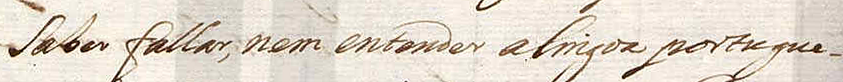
Saber fallar, nem entender a lingoa portugue
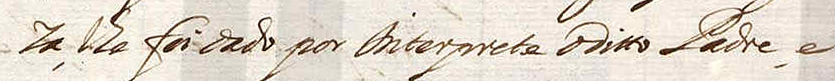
za, lhe foi dado por Interprete o ditto Padre, e
